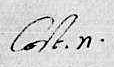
Cost. n.
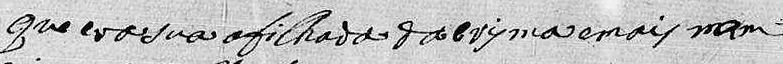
que era sua afilhada da crisma e mais nam
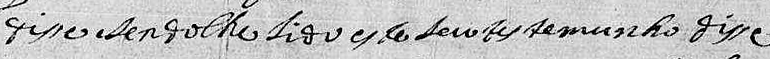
disse sendolhe Lido este seu testemunho disse
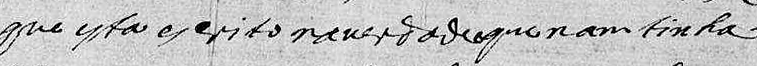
que esta escrito na uerdade que nam tinha
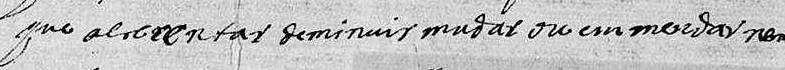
que acrecentar deminuir mudar ou emmendar nem
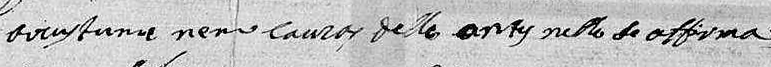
ao custume nem cauzas delle antes nelle se affirma
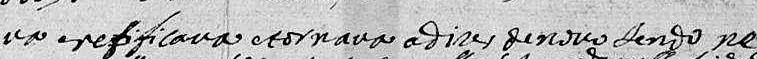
ua e retificava e tornava a dizer de nouo sendo ne
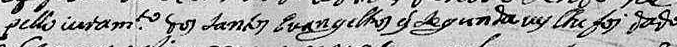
pello iuram.to dos santos Euangelhos q̄ segunda ues lhe foi dado
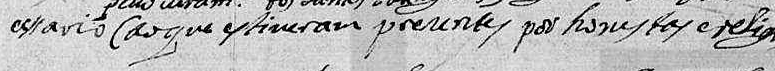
cessario (ao que estiueram prezentes por honestas e religi
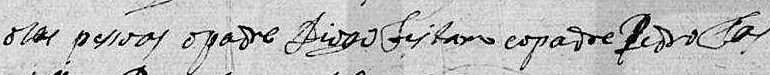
ozas pessoas o padre Diogo Leitam e o padre Pedro Cas
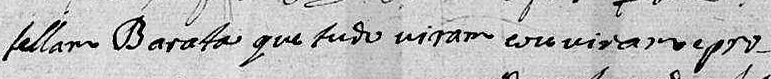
tellam Barata que tudo uiram e ouuiram e pro
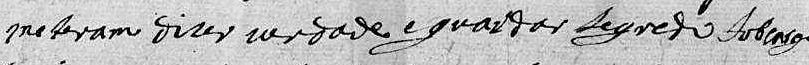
meteram dizer uerdade e guardar segredo sob cargo
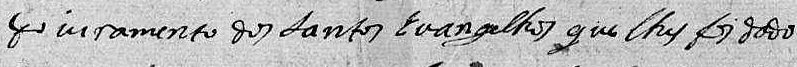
do iuramento dos santos Evangelhos que lhes foi dado
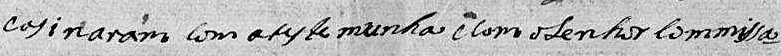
e asinaram com a testemunha e com o senhor commissa
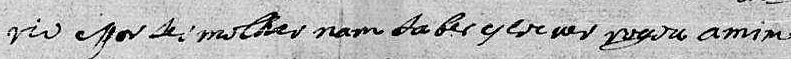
rio e por ser molher nam saber escreuer rogou a mim
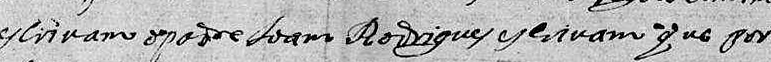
escrivam o padre Ioam Rodrigues escrivam que por
